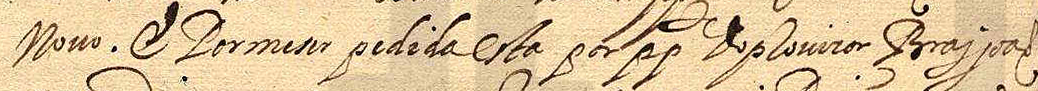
nouo. E Por me ser pedida esta por ppte do pRouizor Bras joaõ
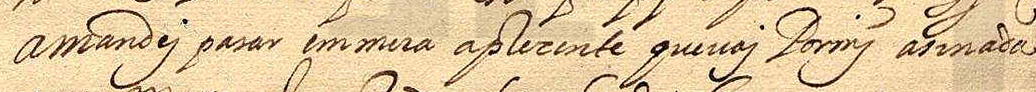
a mandej pasar em meza a pRezente que uaj Por mj̄ asinada
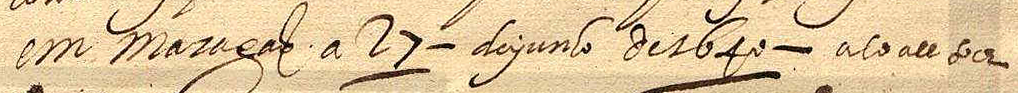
em Mazagaõ a 27 - de junho de 1640 - a coall soes
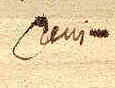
Creui -
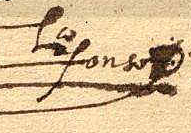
Lco fonso
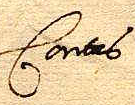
Contas
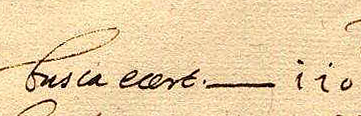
busca e cert. – ii0
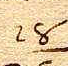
18
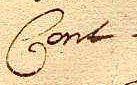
Cont
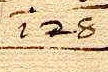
128
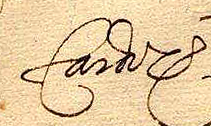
Cardozo
